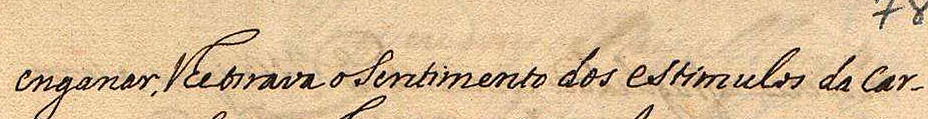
enganar, lhe tirava o sentimento dos estimulos da car
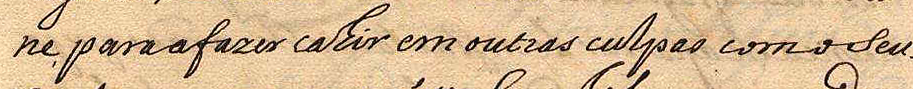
ne, para a fazer cahir em outras culpas com o seu
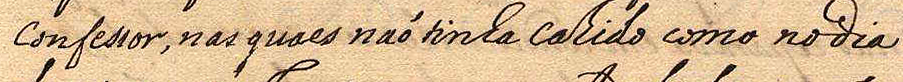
confessor, nas quaes naõ tinha cahido como no dia
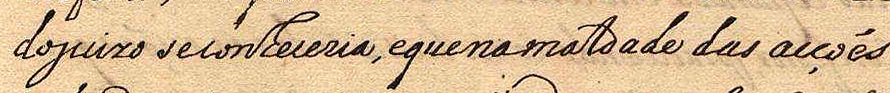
do juizo se conheceria, e que na maldade das acçoẽs
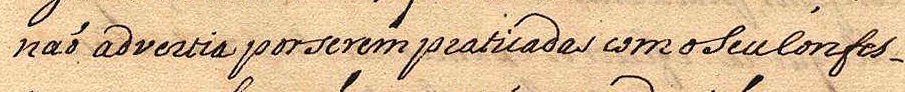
naõ advertia por serem praticadas com o seu confes
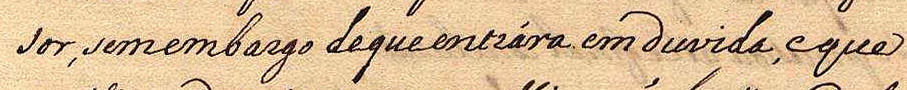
sor, sem embargo de que entrára em duvida, e que
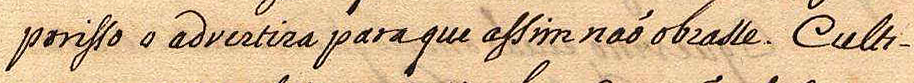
por isso o advertira para que assim naõ obrasse. E ulti
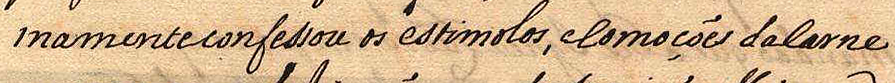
mamente confessou os estimolos, e comoçoẽs da Carne
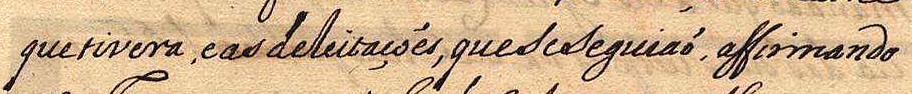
que tivera, e as deleitaçoẽs, que se seguiaõ, affirmando
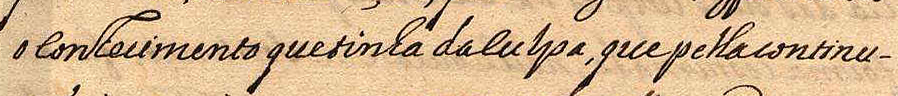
o conhecimento que tinha da culpa, que pella continu
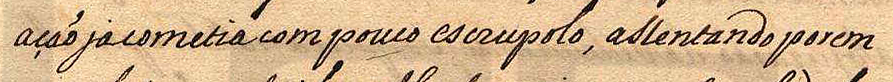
açaõ ja cometia com pouco escrupolo, assentando porem
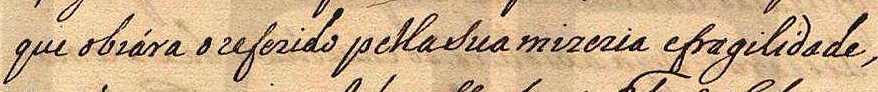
que obrára o referido pella sua mizezia e fragilidade,
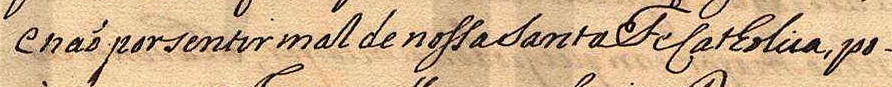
e naõ por sentir mal de nossa Santa Fe Catholica, po
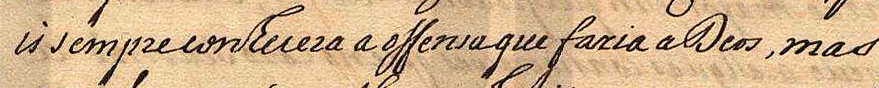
is sempre conhecera a offensa que fazia a Deos, mas
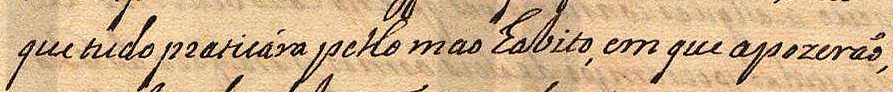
que tudo praticára pello mao habito, em que a pozeraõ,
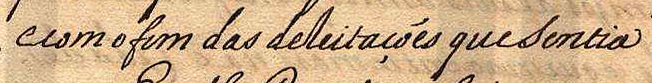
e com o fim das deleitaçoẽs que Sentia
